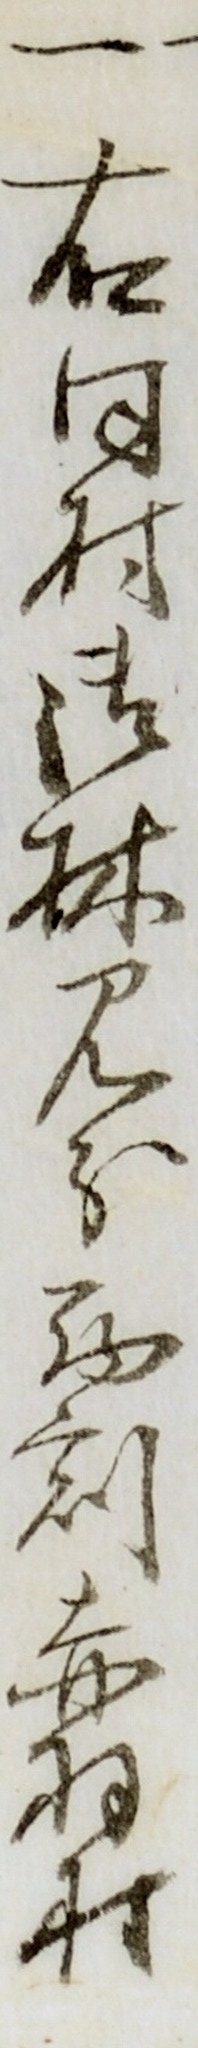一右同村御林見分西割赤羽村
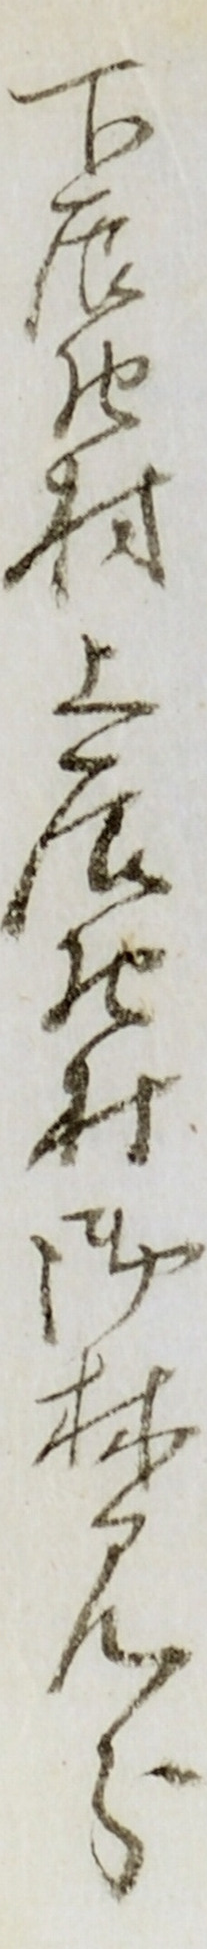下辰野村上辰野村御林見分
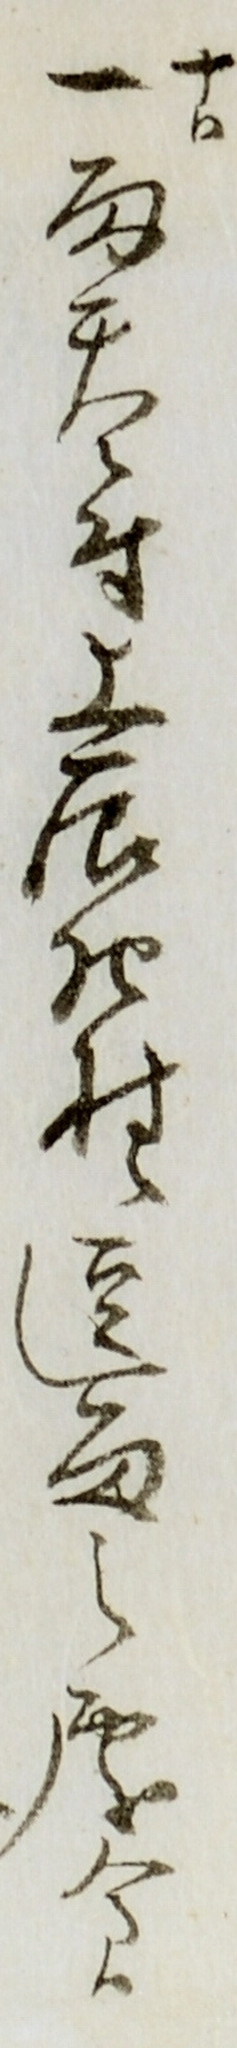一雨天に付上辰野村へ逗留之処今日
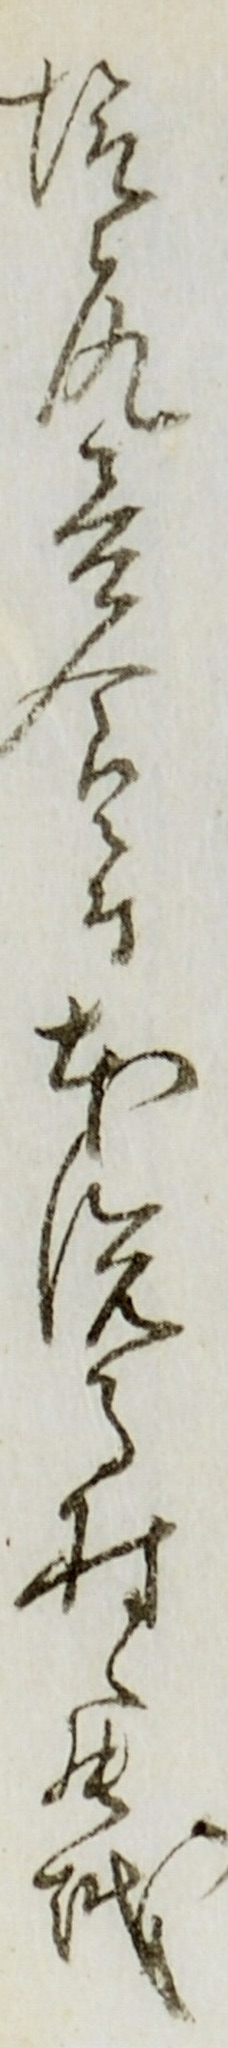塩尻昼食に付本洗馬村へ罷越
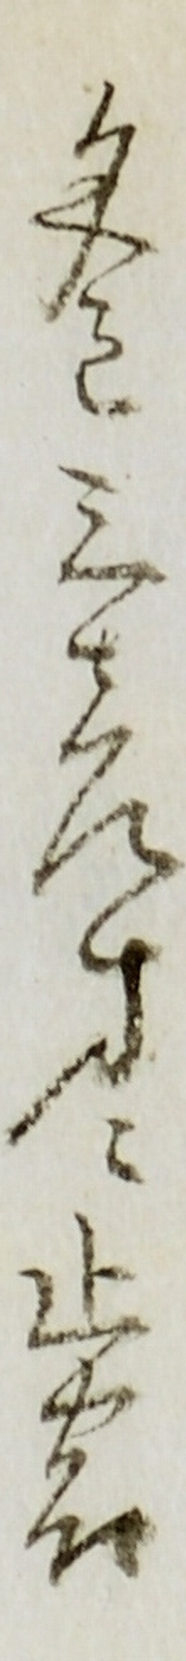名主三彦方に止宿
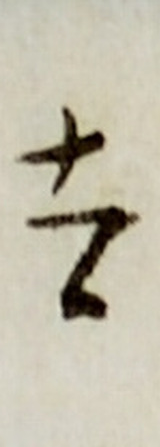十一日
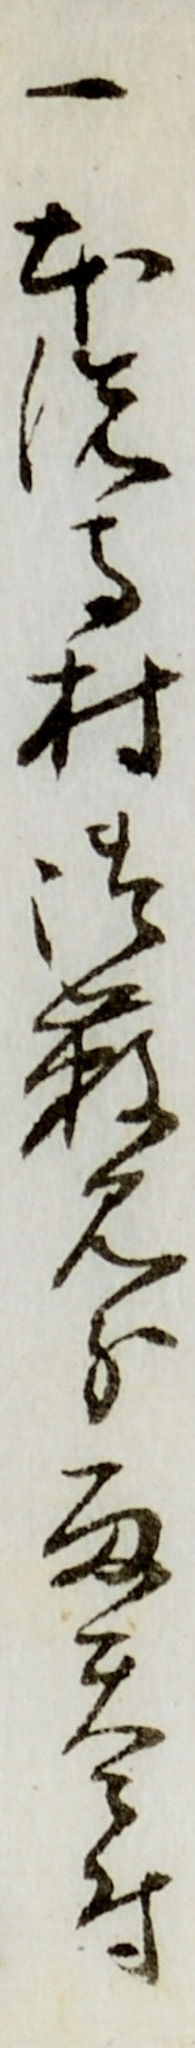一本洗馬村御薮見分雨天に付
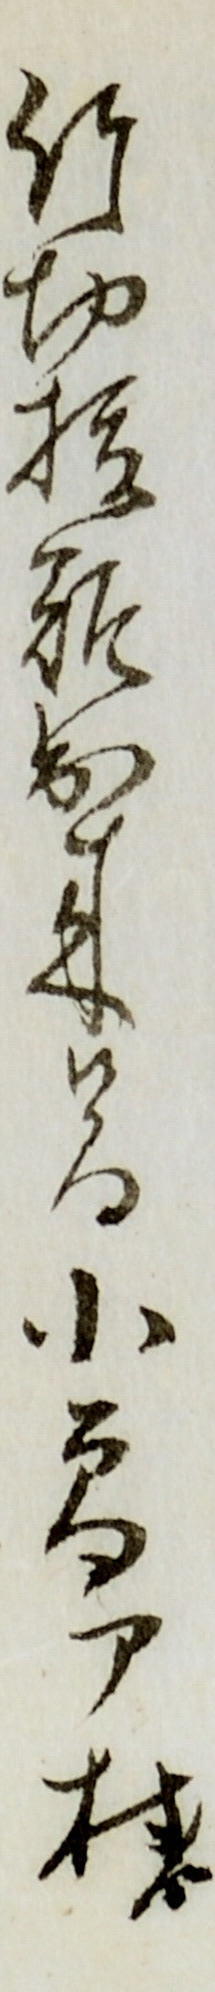竹切抜難出来候間古曽部村ゟ
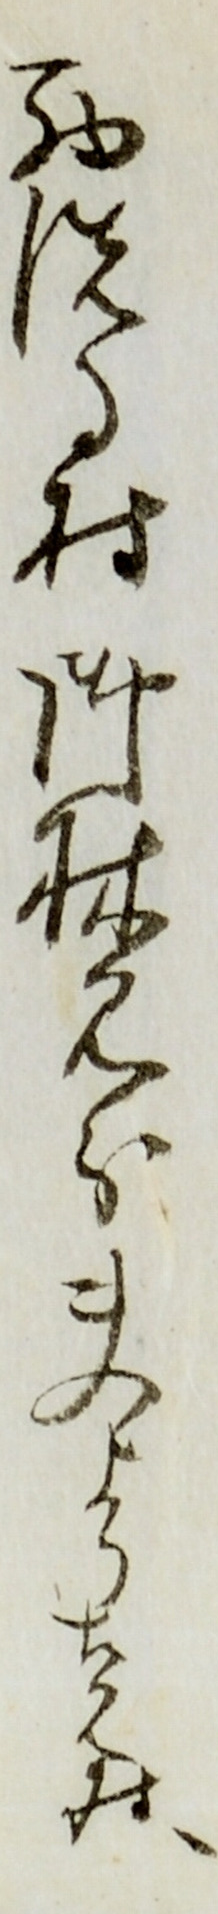西洗馬村御林見分夫より古見村へ
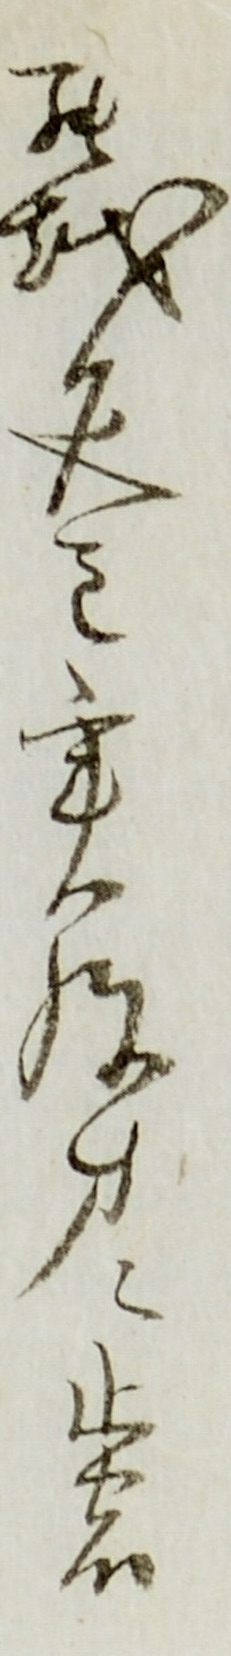罷越名主実方に止宿
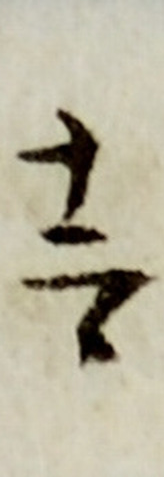十二日
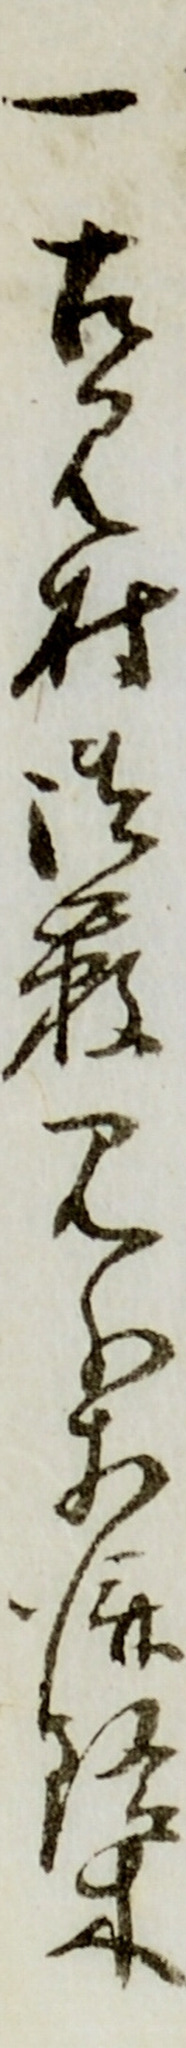一古見村御薮見分相済鈴木
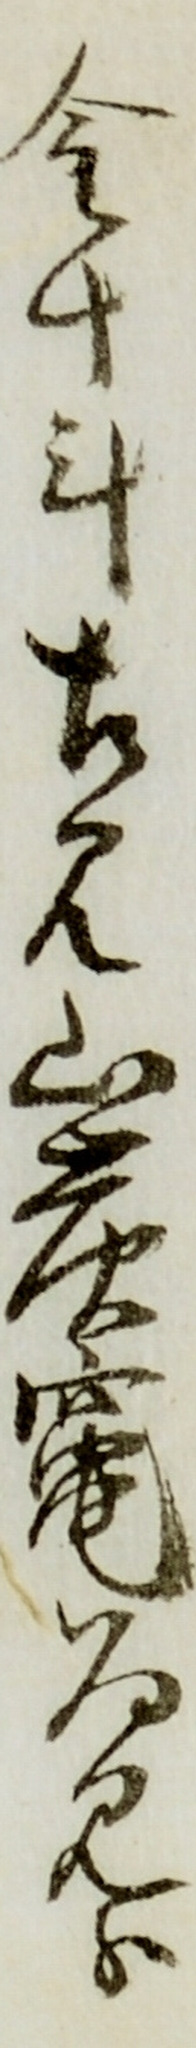金十計古見山炭竃為見分
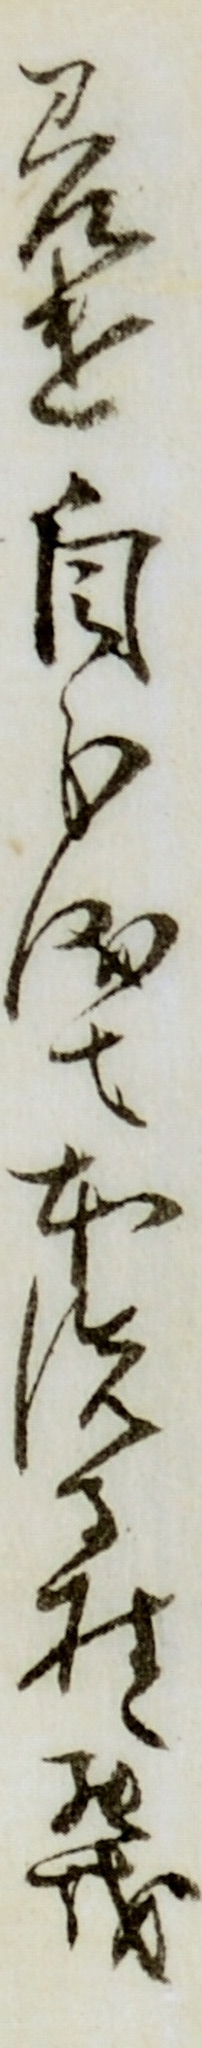差遣自分儀は本洗馬村へ罷越
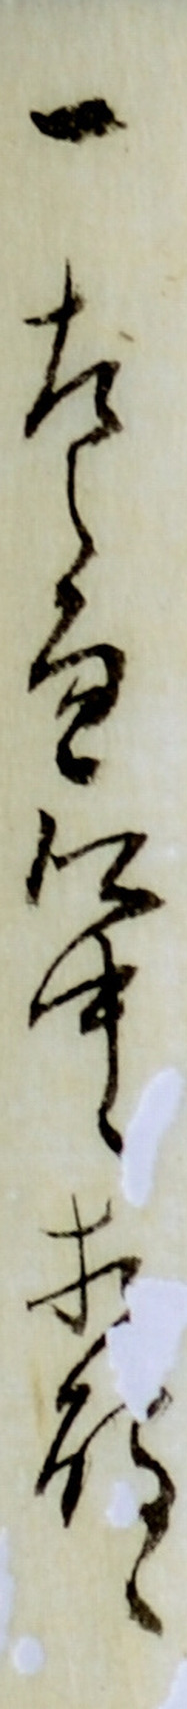一左之通郷中へ相触候

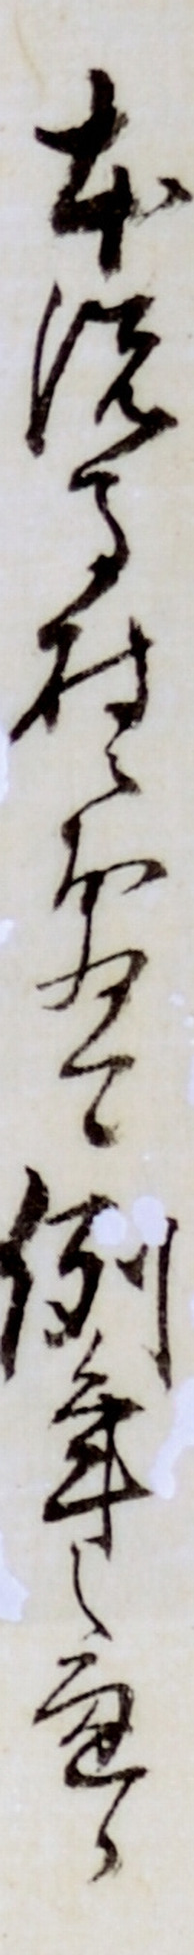本洗馬村におゐて例年之通り
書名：山林方諸事御用留
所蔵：伊那市立高遠町図書館・合同会社AMANE
